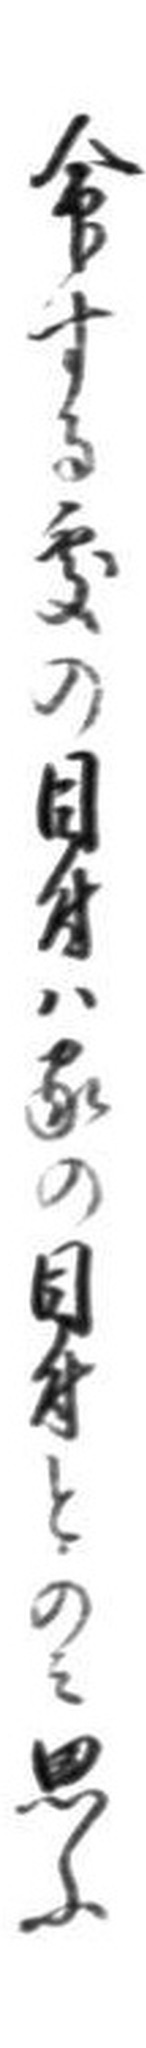命する処の目付は家の目付とのみ思ふ
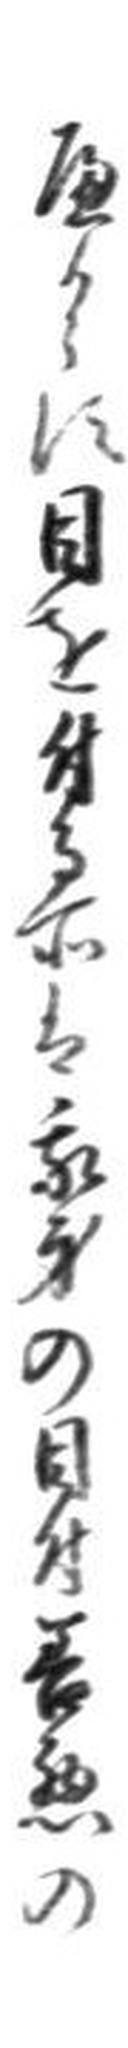へからす目を付る所は我身の目付善悪の
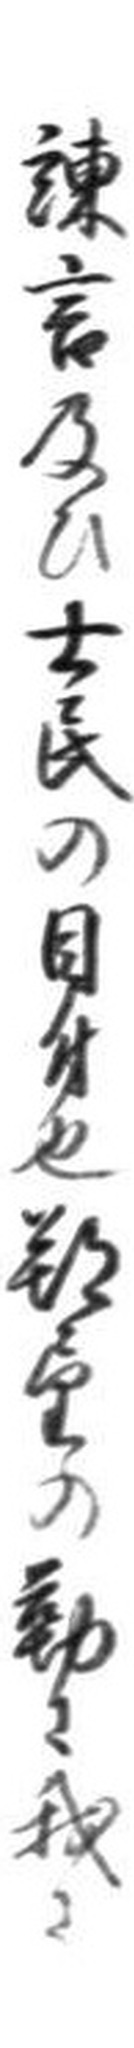諫言及ひ士民の目付也朔望の勤に我に

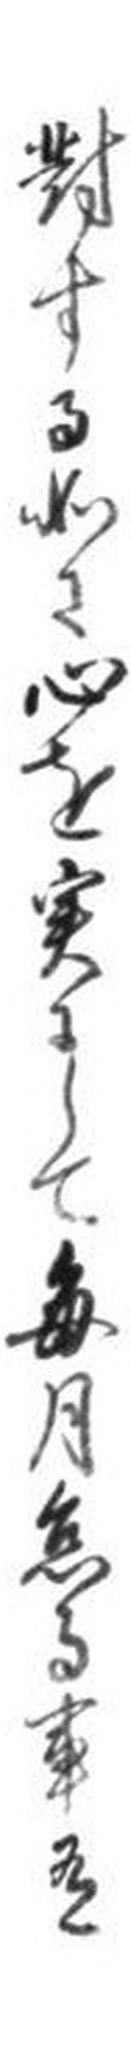対する如き心を実にして毎月怠る事有
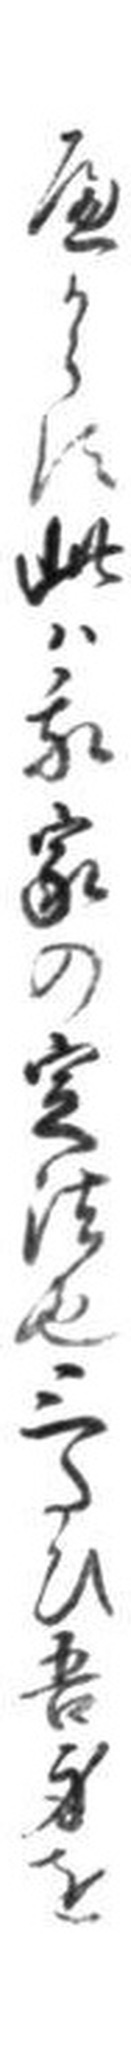へからす此は我家の定法也三たひ吾身を
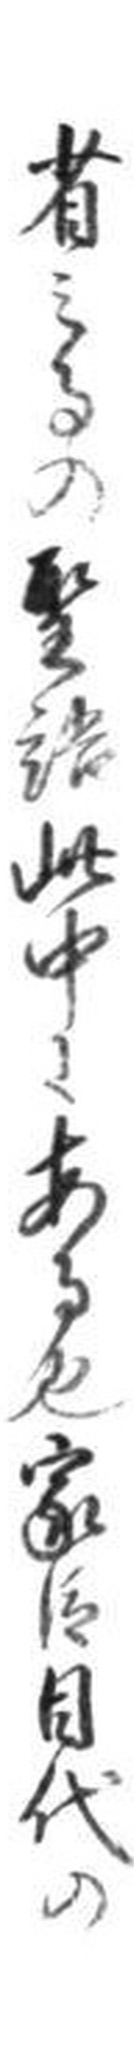省みるの聖語此中にある也家臣目代の
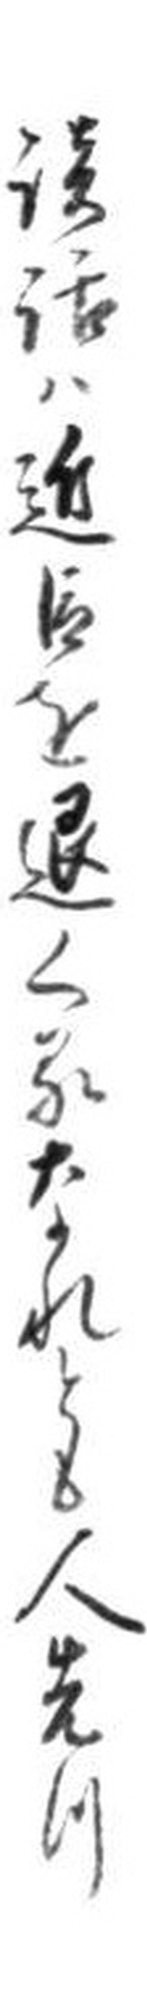談話は近臣を退くるなれとも人先つ
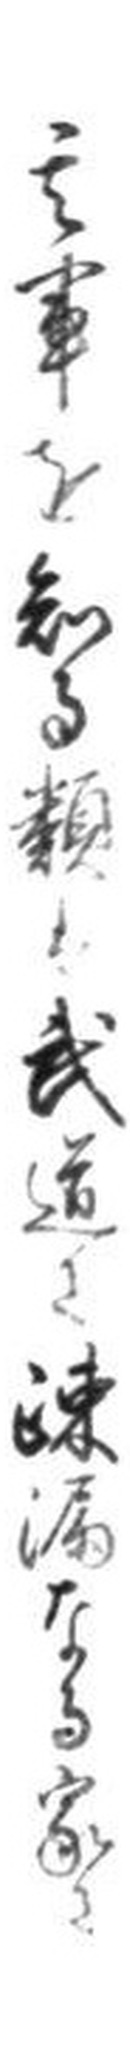其事をしる類は武道に疎漏なる家に
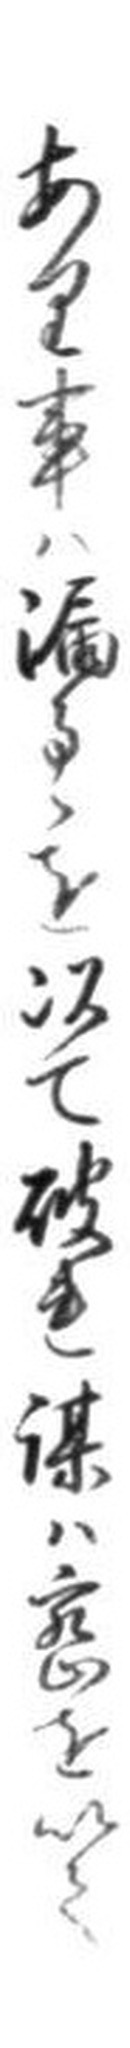あり事は漏るゝを以て破れ謀は密を以て
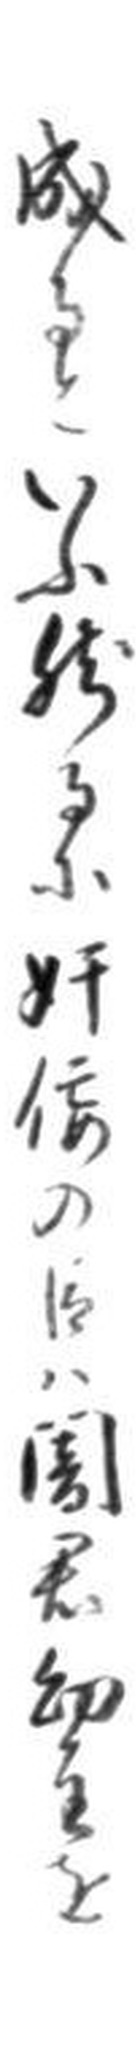成るといふ然るに奸佞の臣は闇君幼主を
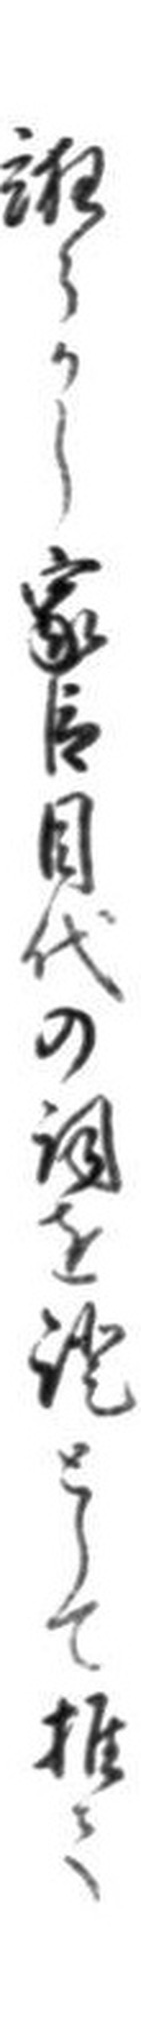誑らかし家臣目代の詞を証として推て
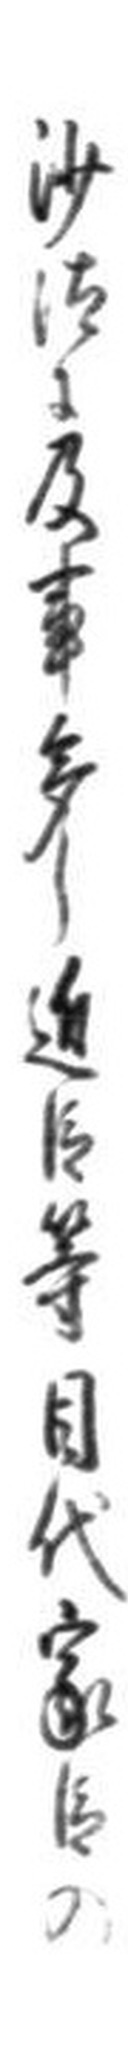沙汰に及事多し近臣等目代家臣の
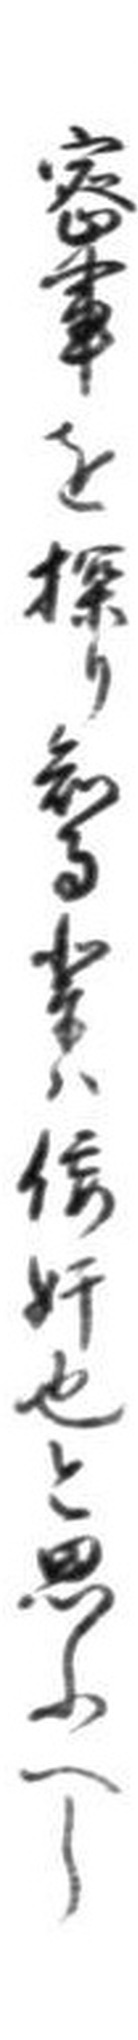密事を探り知る輩は佞奸也と思ふへし
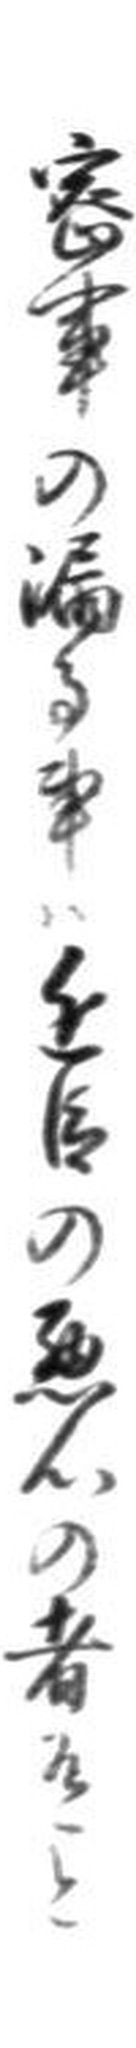密事の漏る事は近臣の悪心の者有と
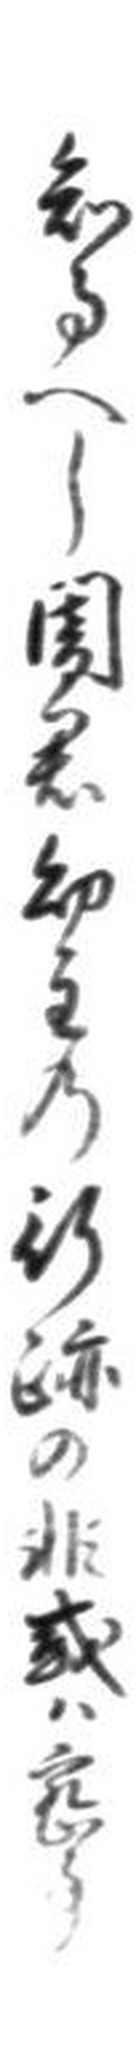知るへし闇君幼主の行跡の非或は密事
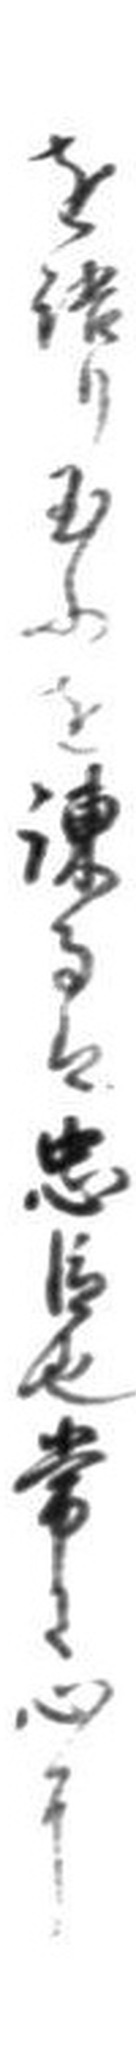を語り玉ふを諫るは忠臣也常に心に
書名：家譜 一 秀康公 従天正二年到慶長十二年
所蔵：福井県文書館 Fukui Prefectural Archives
